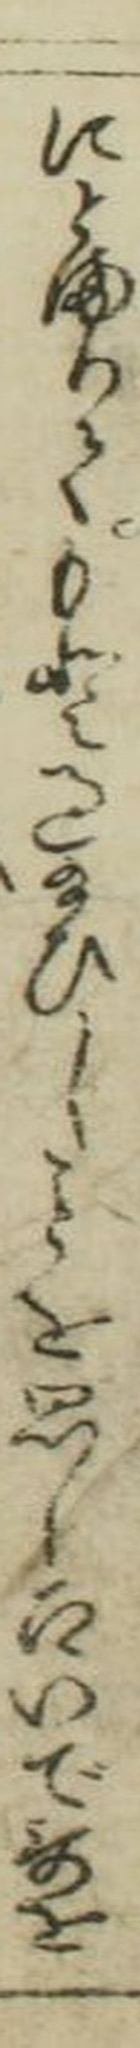にとまりて。もと過給ひしことを思し召いで哥を
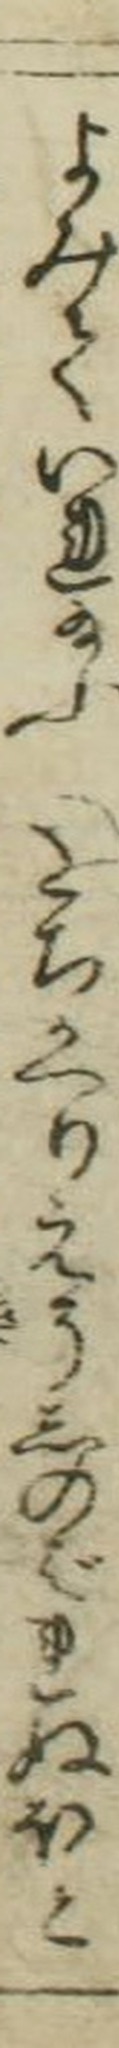よみていれ給ふ〽をちかへりえそしのばれぬほと
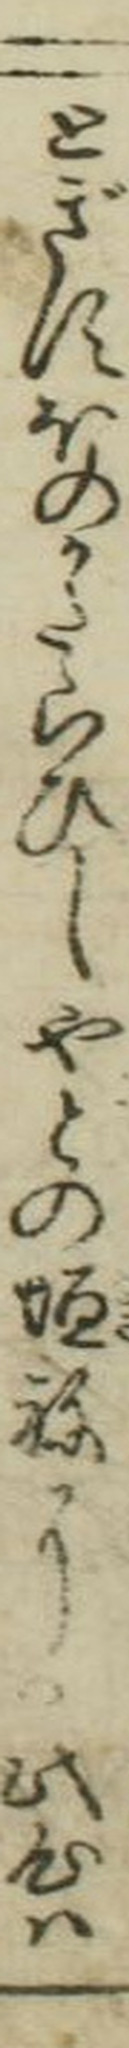とぎすほのかたらひしやとの垣ねに○此心は
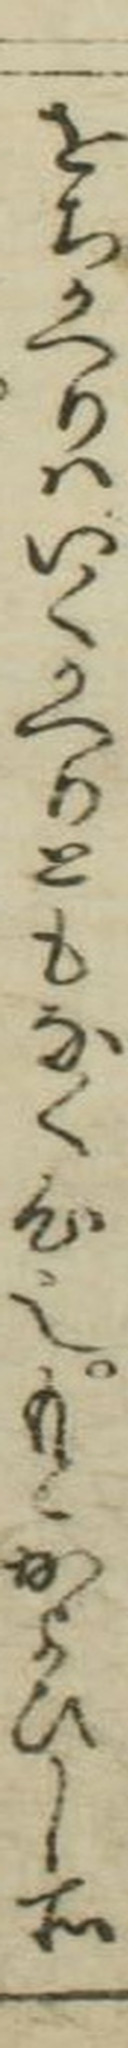をちかへりはいくかへりともなく心也。もとかよひし所
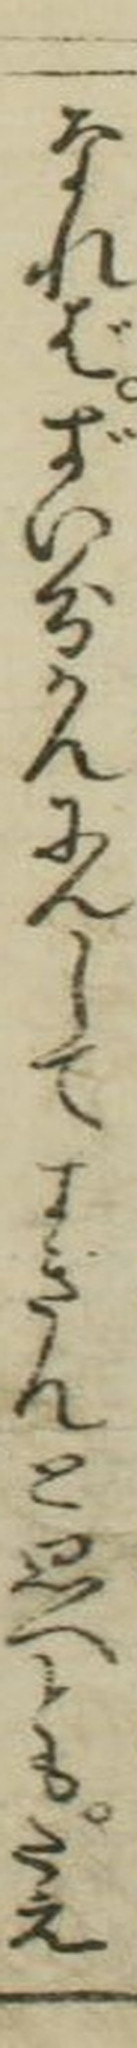なれば。ずい分かんにんしてすぎんと思へとも。たえ
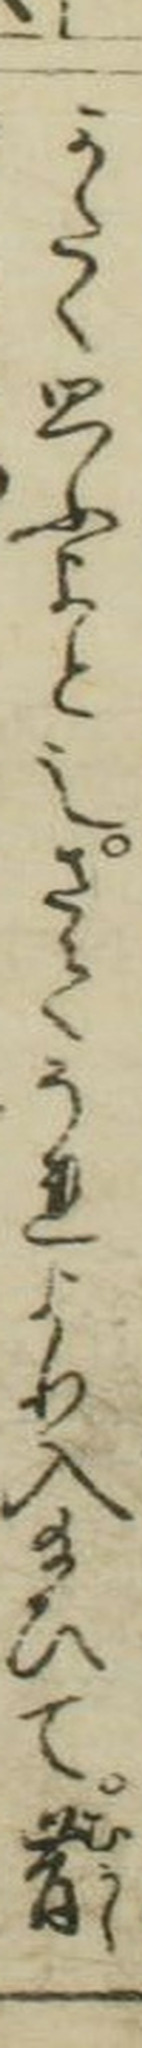かたく思ふよと也。さてそれより入給ひて。昔
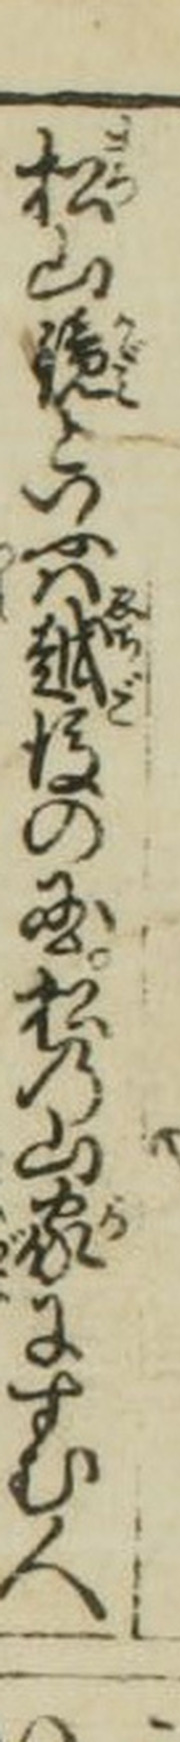松山鏡といふは越後の国。松の山家にすむ人
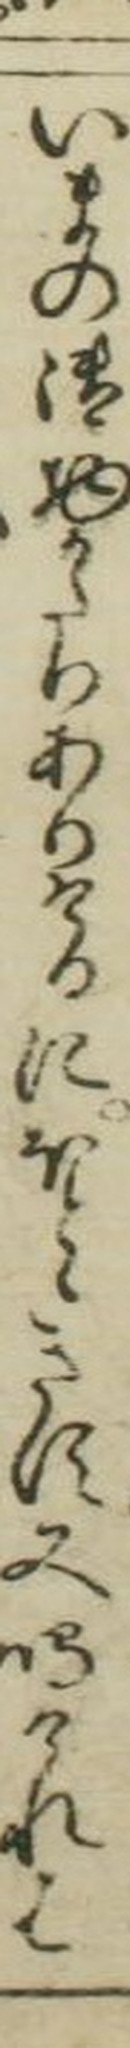いまの御物かたりありけるに。ほとゝきす又鳴けれは
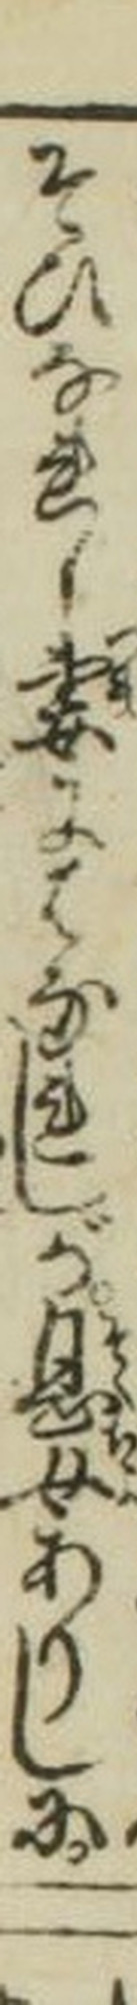そひなれし妻にはなれしが。息女ありしに。
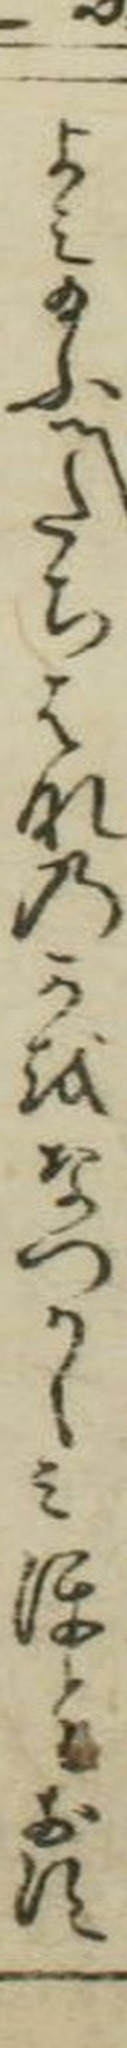よみ給ふ〽たちはなのかをなつかしみほとゝぎす
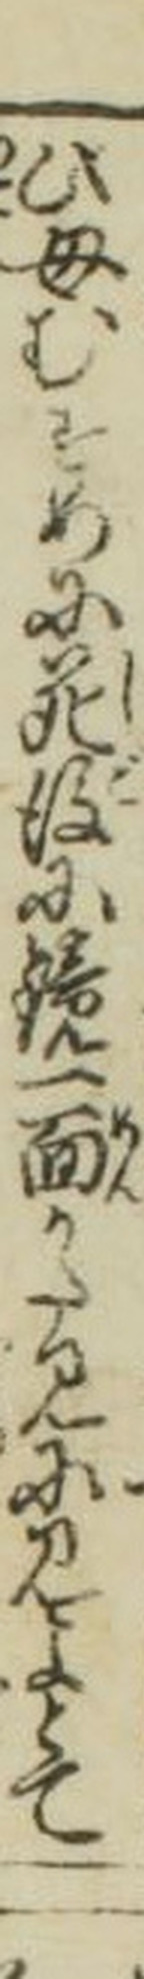此母むすめに死後に鏡一面かたみに見よとて
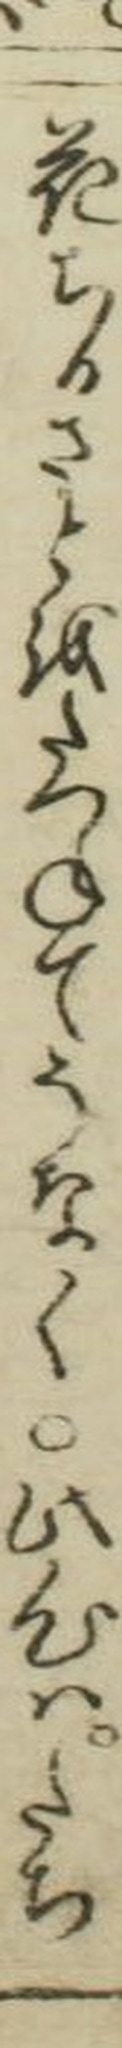花ちるさとをたつねてそなく○此心は。たち
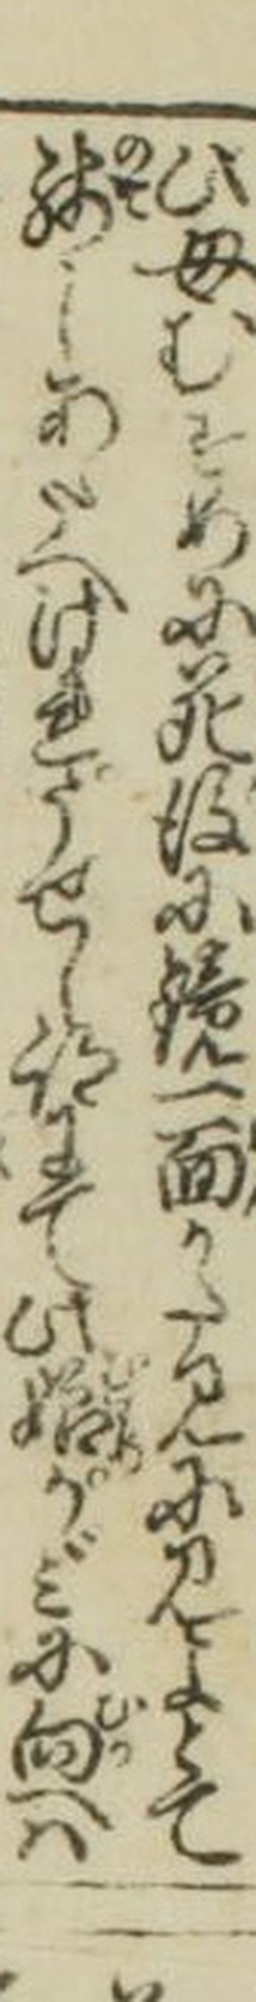残しあたへけれ。うせし跡にて此娘。かゞみに向へは
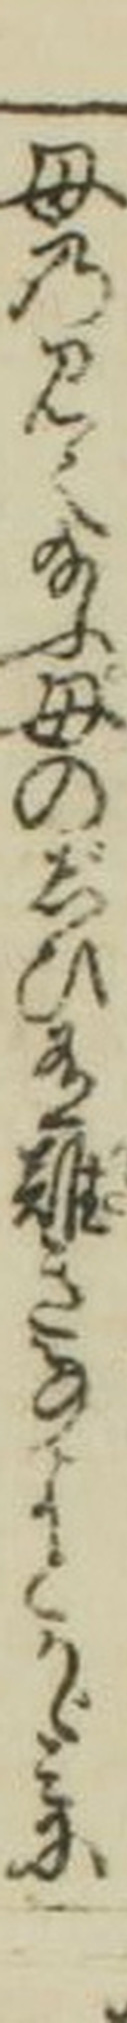母の見え給ふ。母のじひ有難き事よとかゞみに
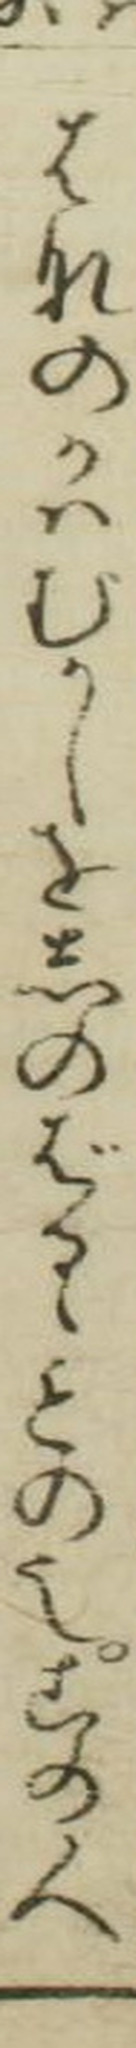はなのかはむかしをしのばるゝもの也。この人
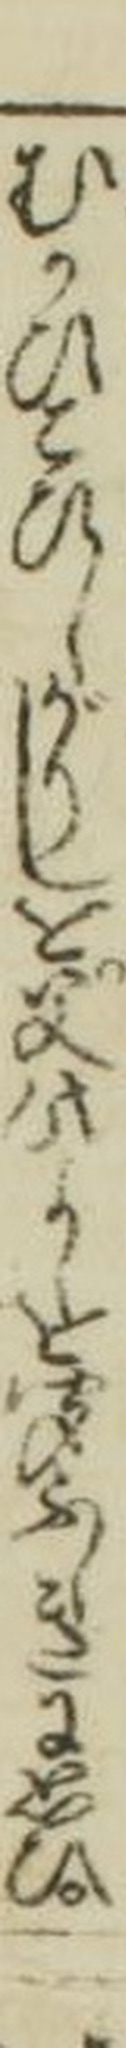むかひこひしがりしを。父此よしを聞ふしきに思ひ。
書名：女源氏教訓鑑
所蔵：東京学芸大学附属図書館
